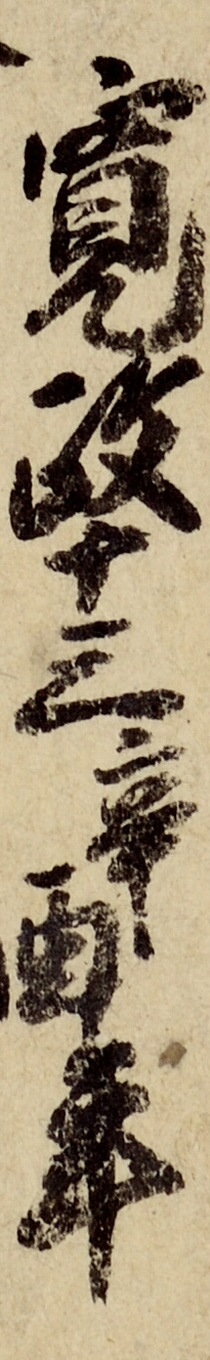寛政十三辛酉年
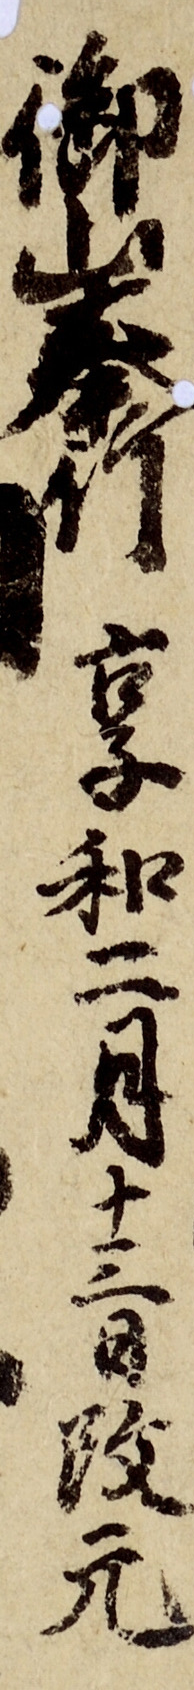御山奉行享和二月十三日改元
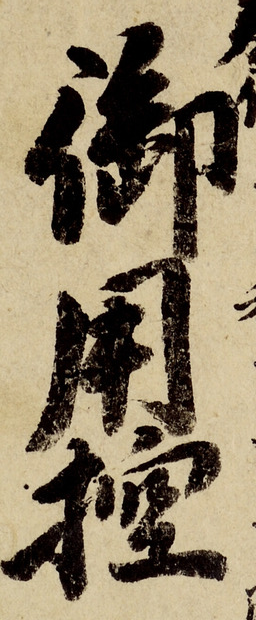御用控

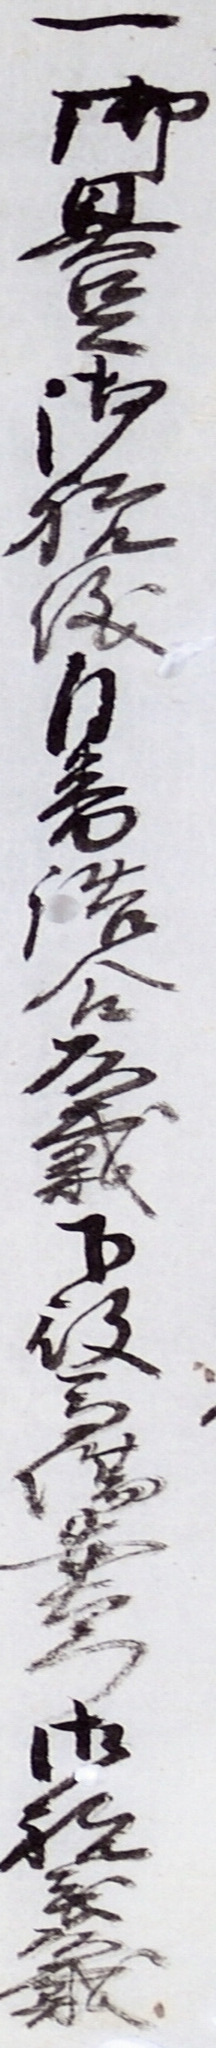一御具足御祝儀月番詰合頂戴下役馬場安右衛門御祝義頂戴
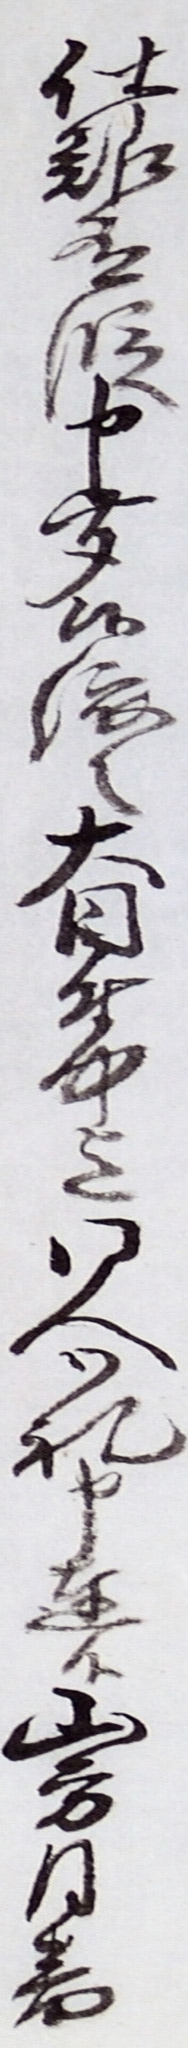仕難有段申聞候依之大目付中迄同人御礼申達候山方月番
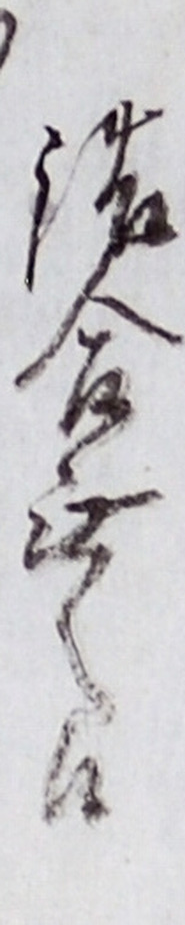詰合無之候
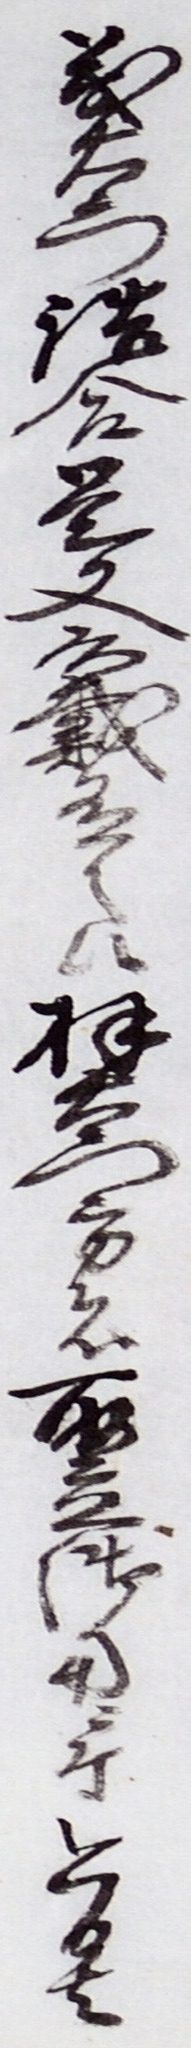義右衛門詰合是又頂戴有之候羽右衛門方は取立御用ニ付今日は
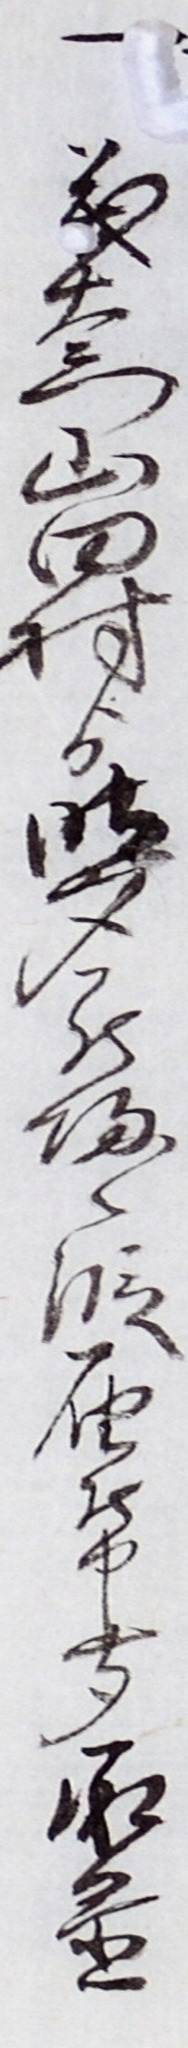一義右衛門山田村ゟ明夕罷帰候段届被申聞承置
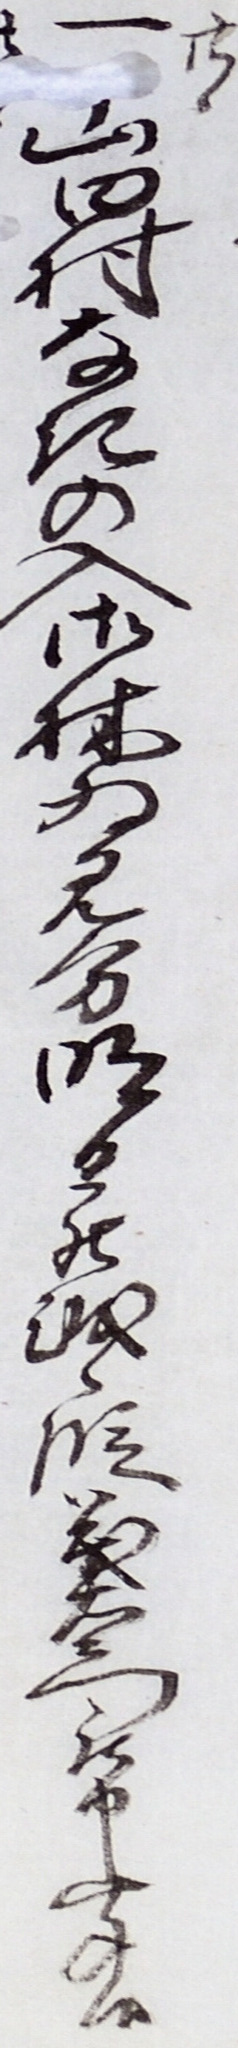一山田村なきの入御林為見分明日罷越候段義右衛門被申聞候
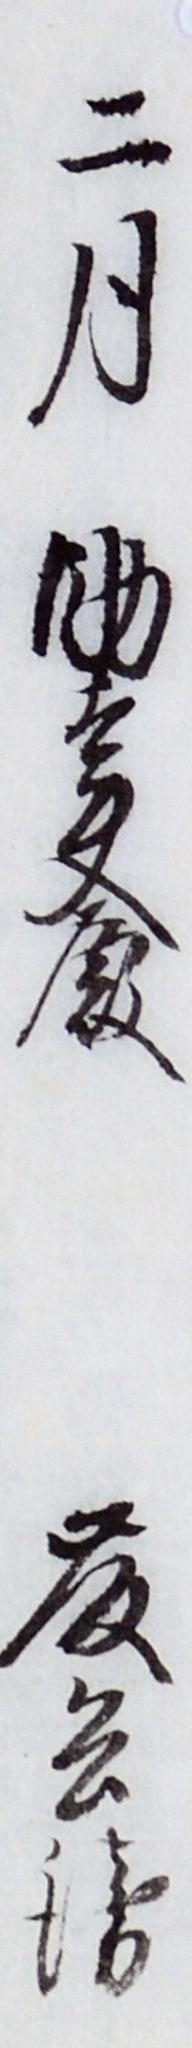二月助太夫殿藤兵衛
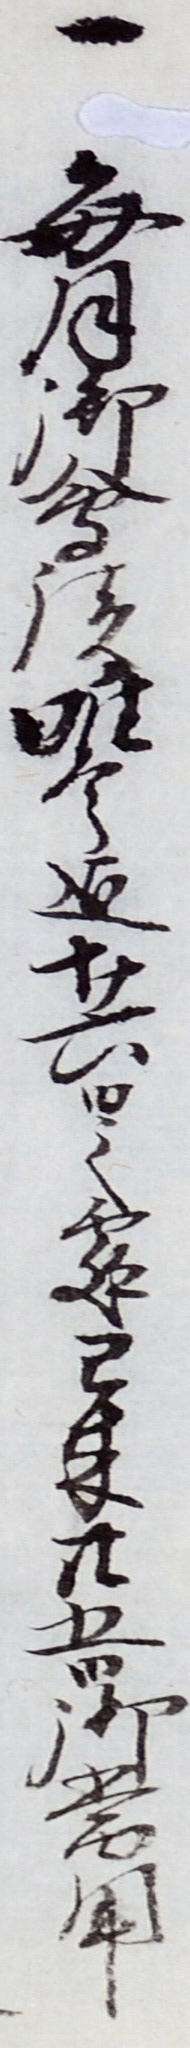一毎月御会談唯今迄廿六日之処已来廿五日御当用
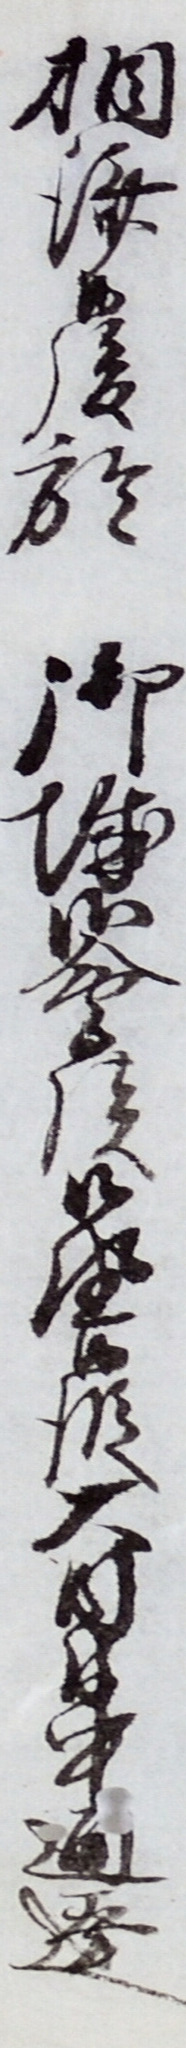相済候後於御城御会談御座候段大目付申通達
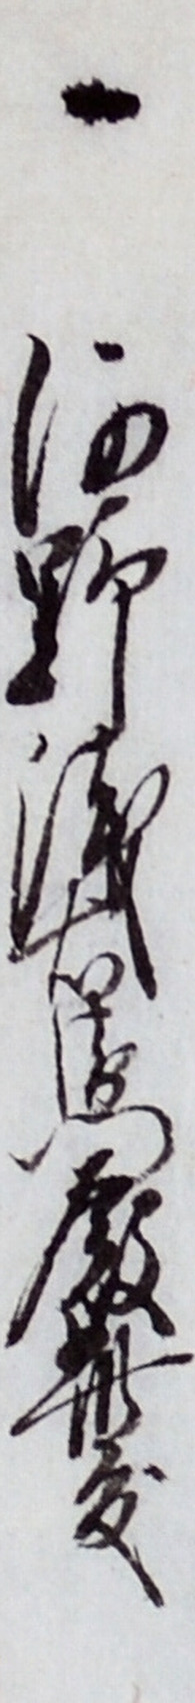一河野浅右衛門殿此度
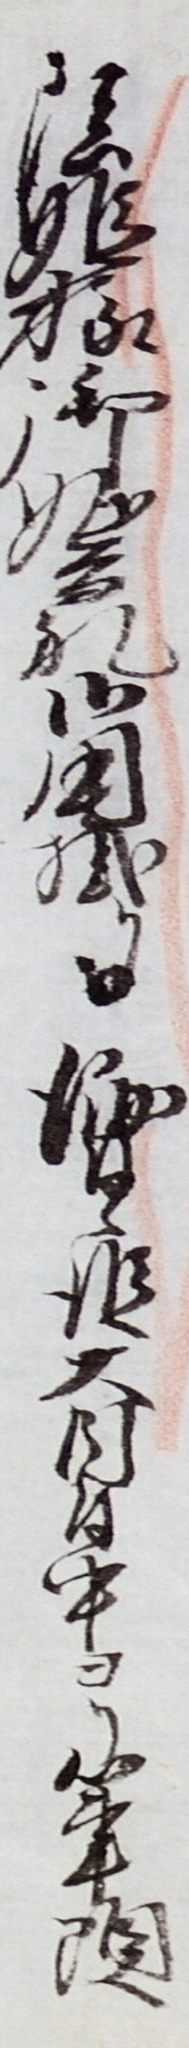陰姫様御婚礼御用掛り被仰付候段大目付中ヨリ筆頭
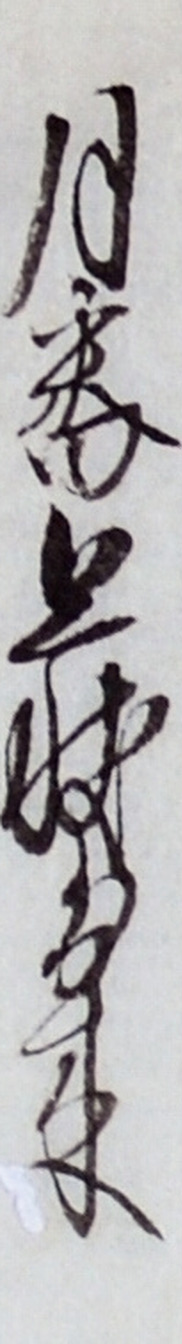月番廻状出来
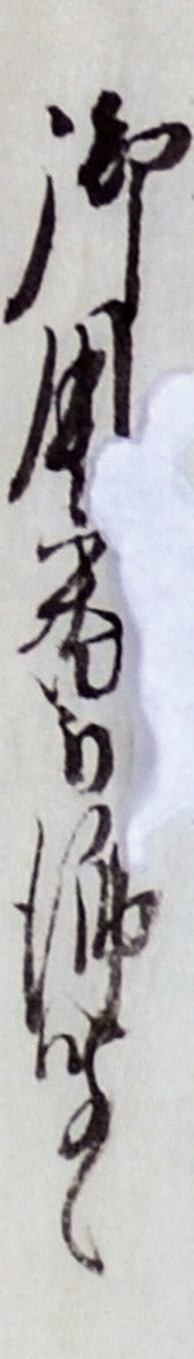御用番被仰聞候
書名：御山奉行御用控
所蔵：伊那市立高遠町図書館・合同会社AMANE
